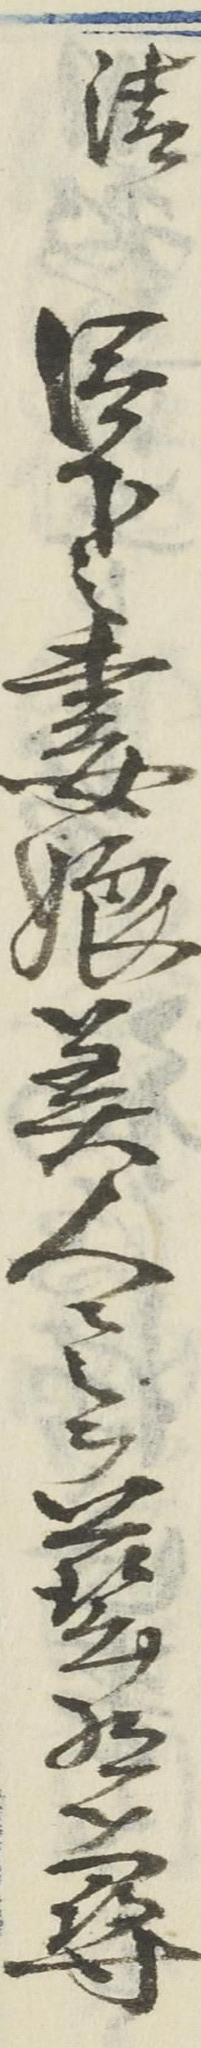清臣下之妻娘美人ニシテ藝有ヲ尋
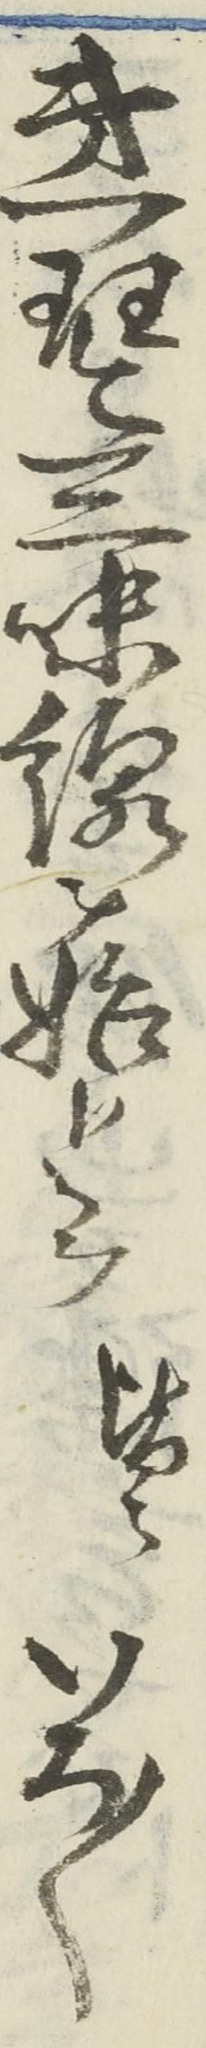第一琴三味線ヲ始トシテ皆々いろ〳〵
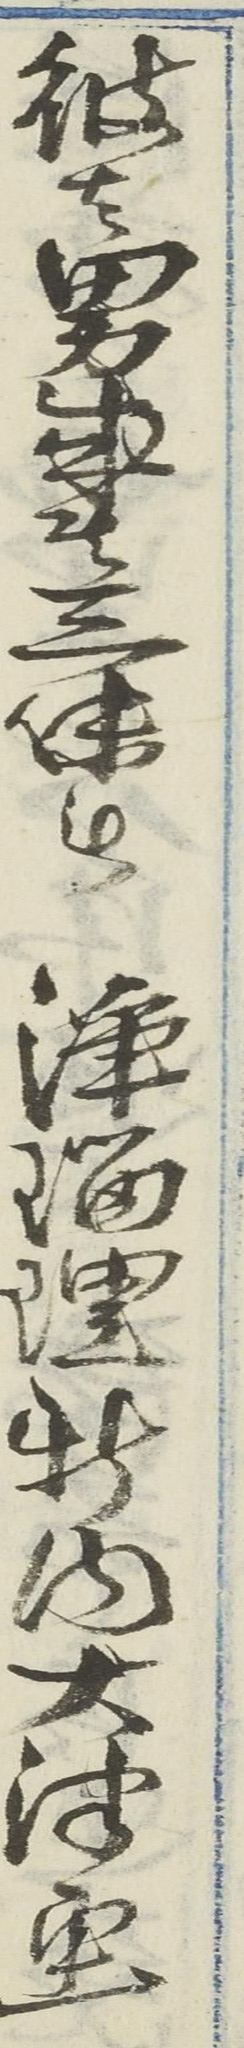彼は男成共三味も浄瑠璃新内大津画
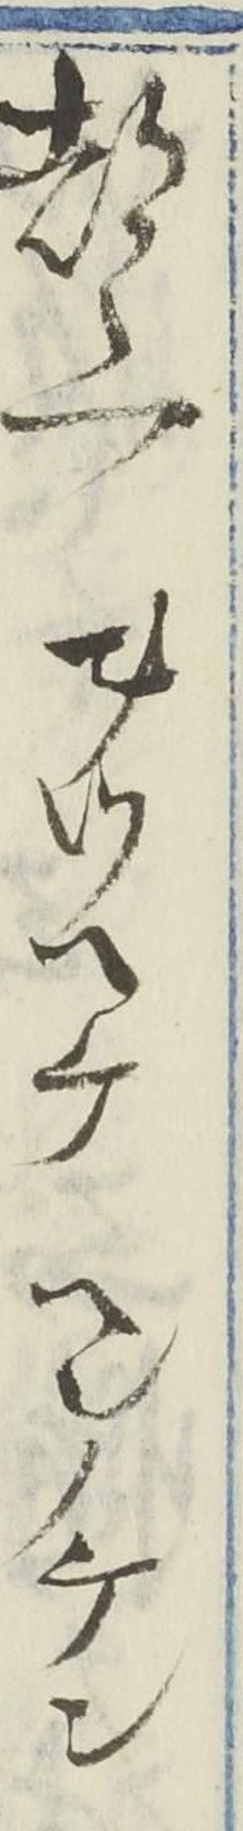都ゝ一ヲツヘテヘレノケン
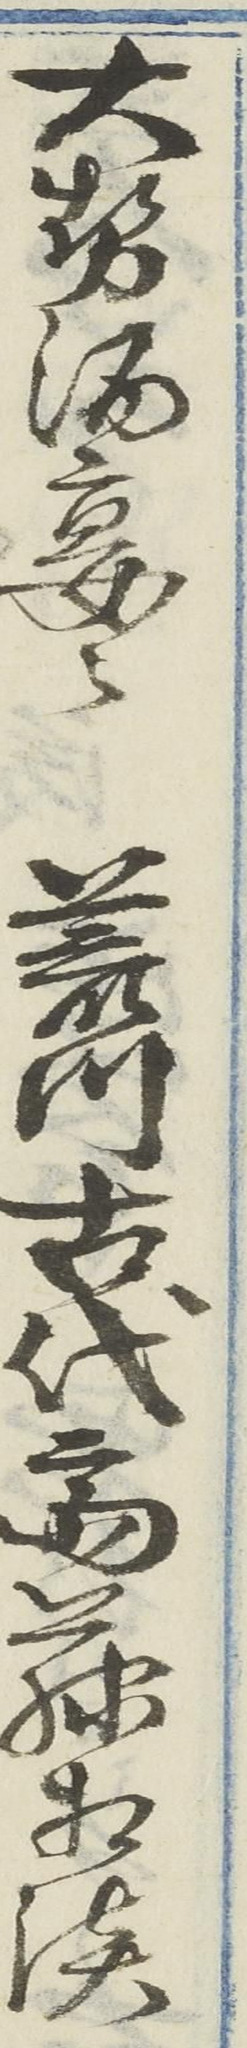大勢酒宴ニ荒川古代斉藤相談
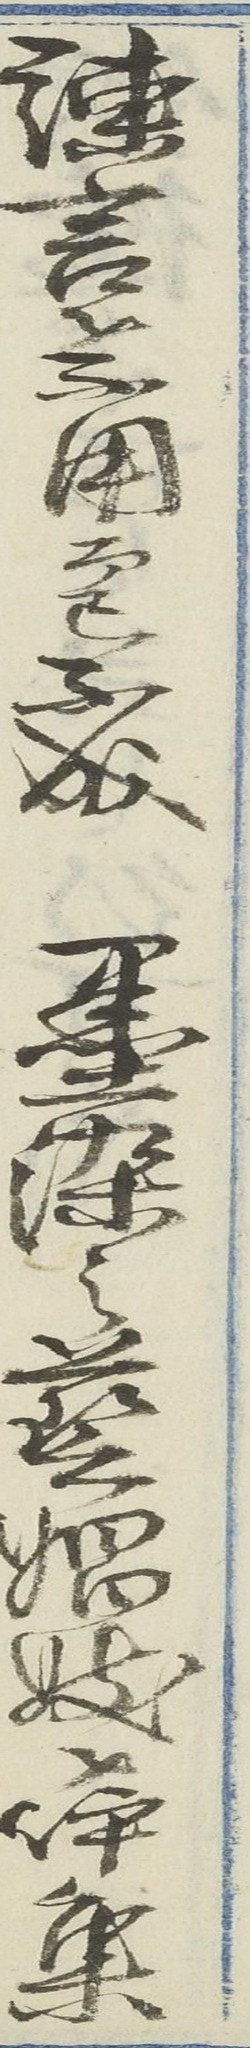諌言ヲ不用而巳不成墨染之藝娼妓ヲ呼集
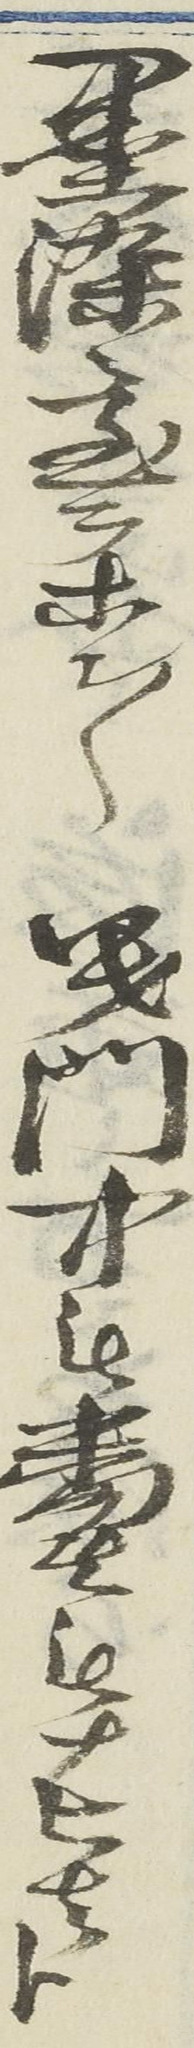墨染ニ至テホン〳〵閉門中も番共もナヒはト
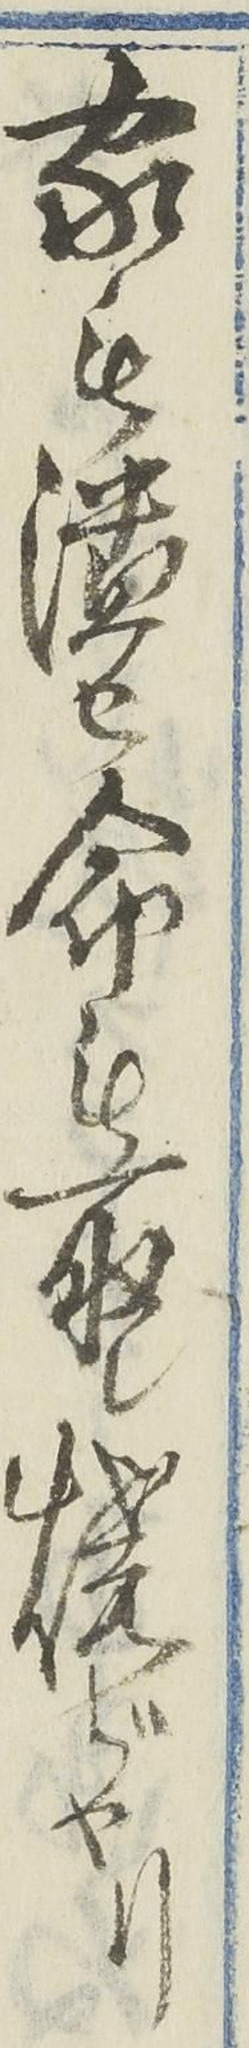家も潰セ命も取レ焼ぢや？
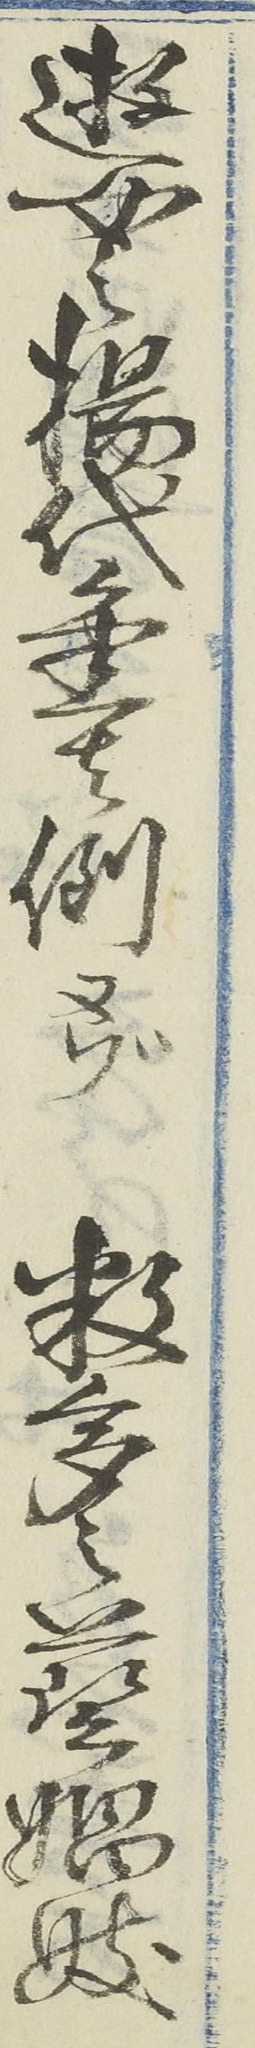遊女之揚代金は倒ヌゾ数多之藝娼妓
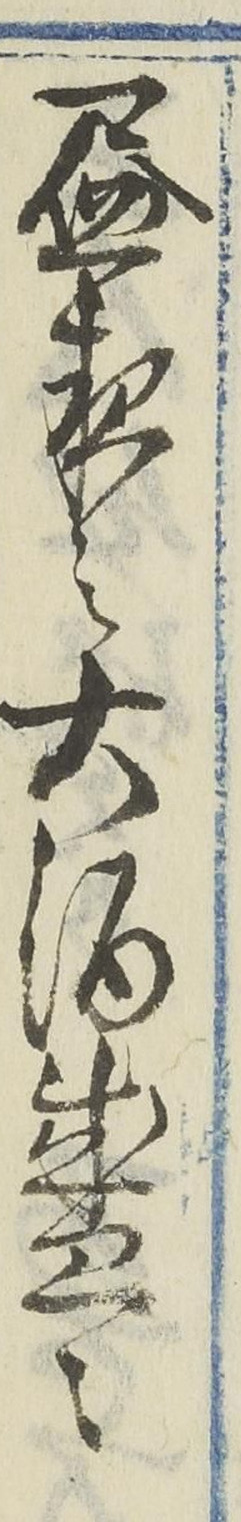昼夜之大酒盛ニ

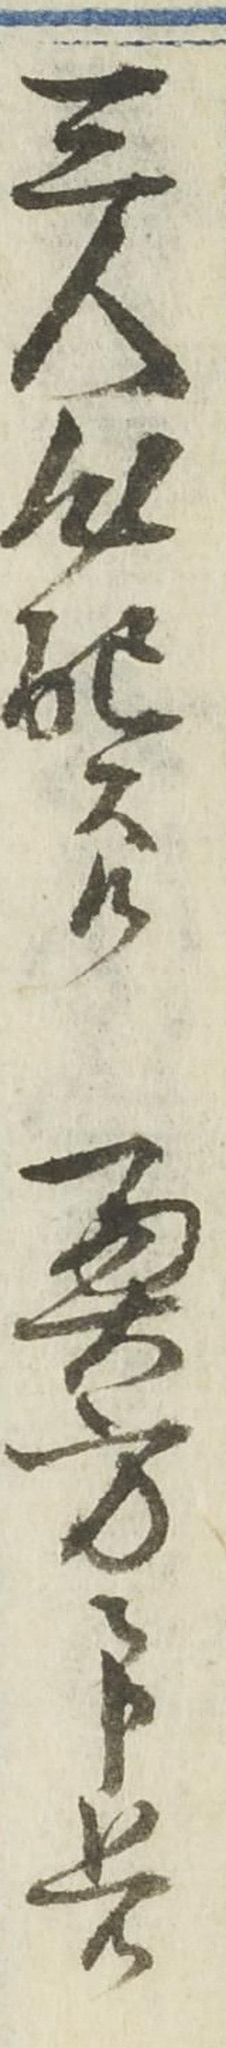三人心配スル奥方ニ申上ル
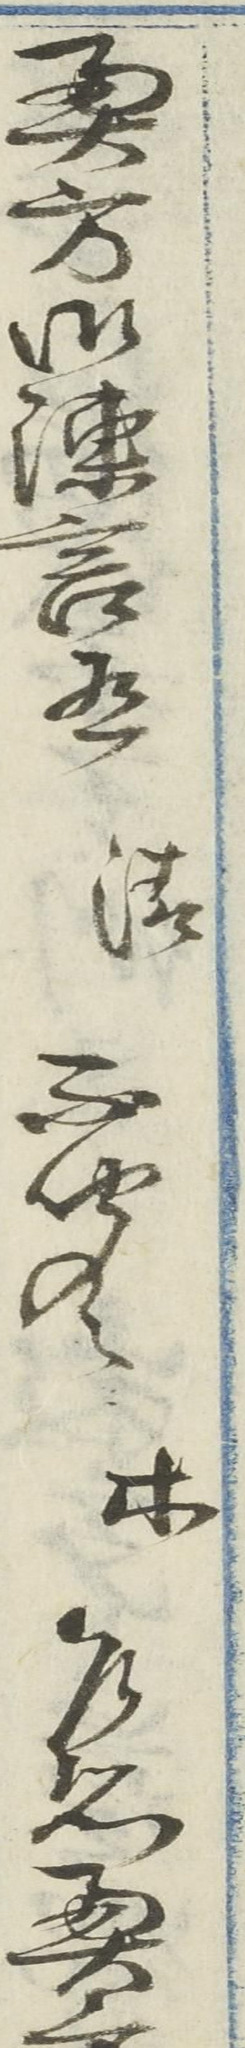奥方御諌言有清不聞之木乍恐奥方
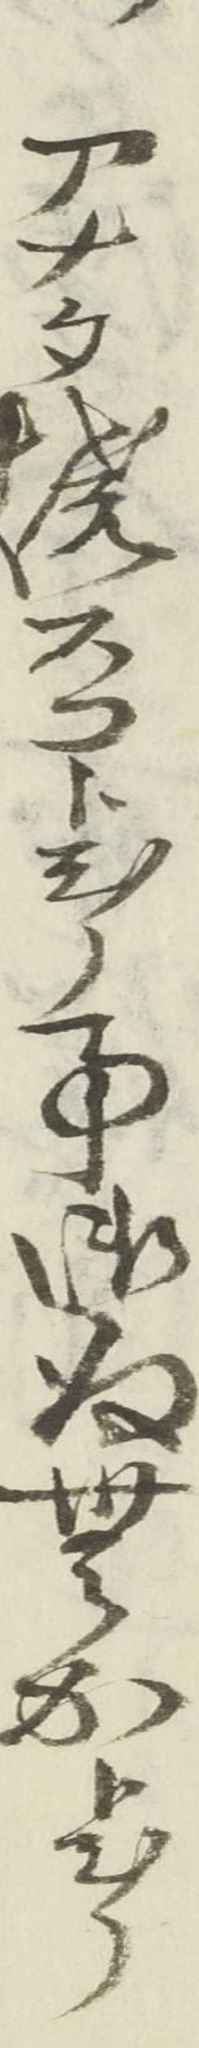芥アナタ焼スコト云う事御存無かト云う
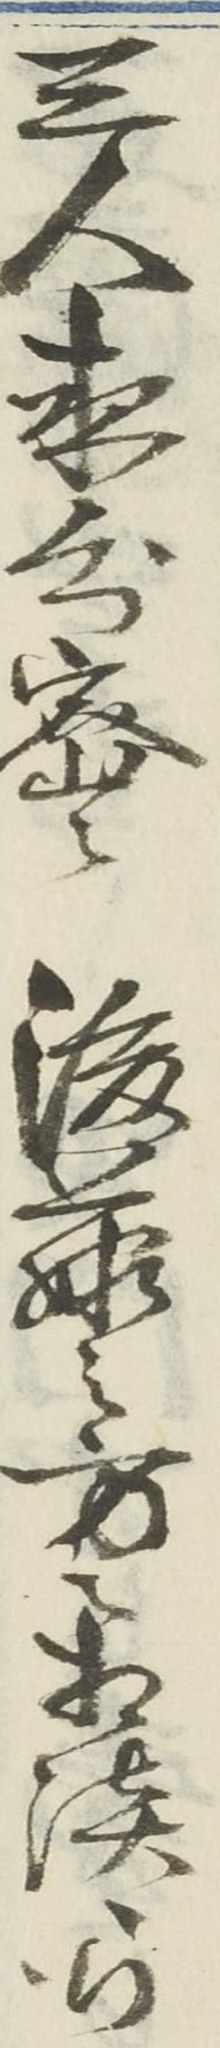三人夜分密ニ後藤之方ニ相談ニ行
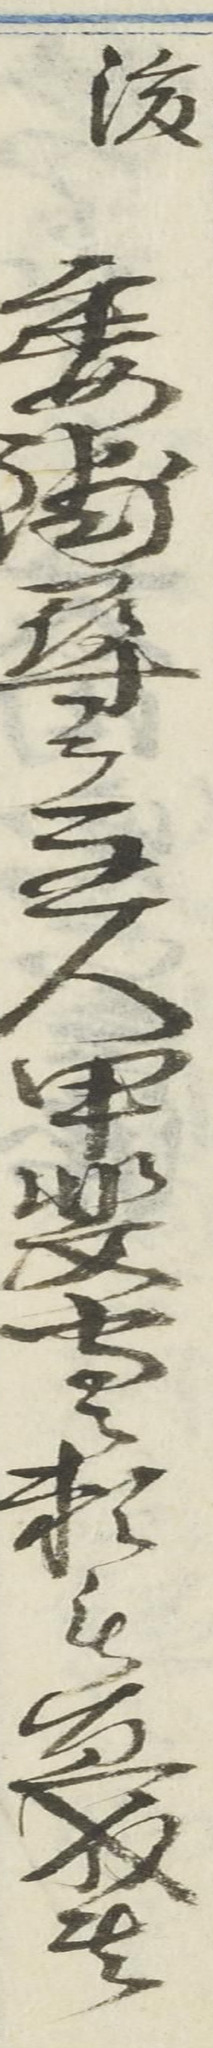後委舗尋テ主人甲斐守ニ頼も宜成共
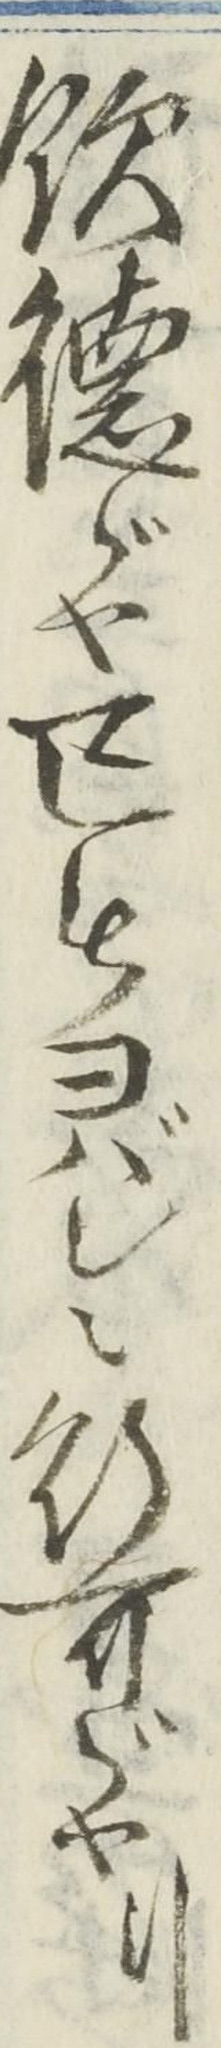飲徳ぢヤ巳モヨバレニ行可じヤ
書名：伏水大地震
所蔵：東京大学地震研究所図書室 Earthquake Research Institute Library, The University of Tokyo, JAPAN
